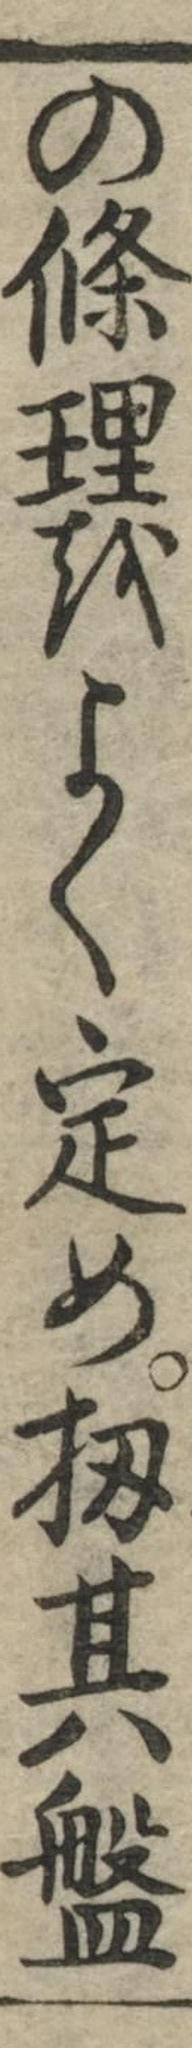の條理をよく定め。扨其盤
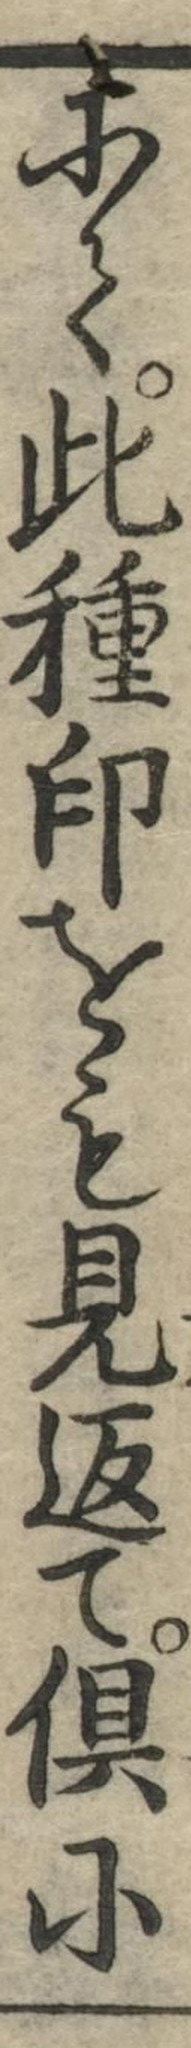にて。此種印をも見返て。俱に

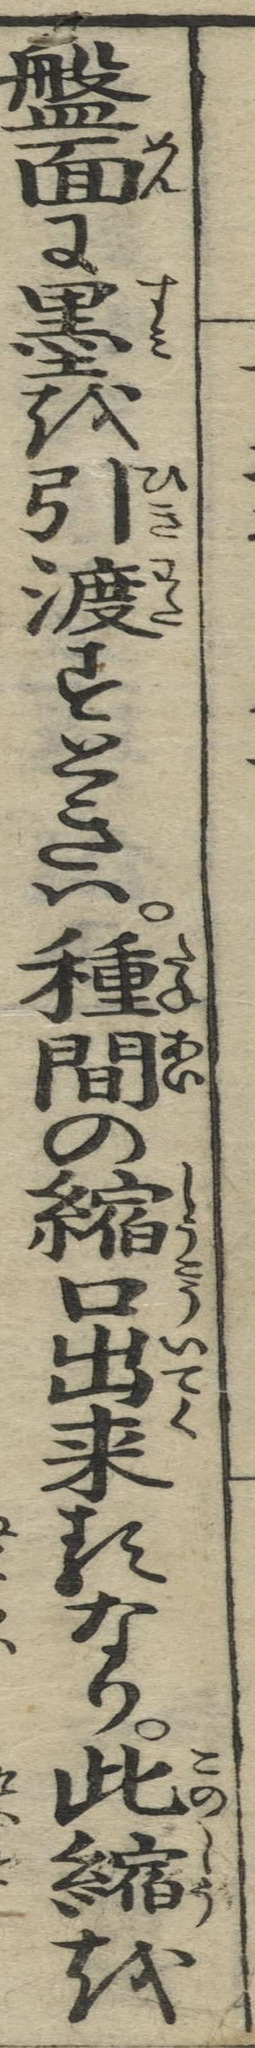盤面に墨を引渡すときは。種間の縮口出来るなり。此縮を
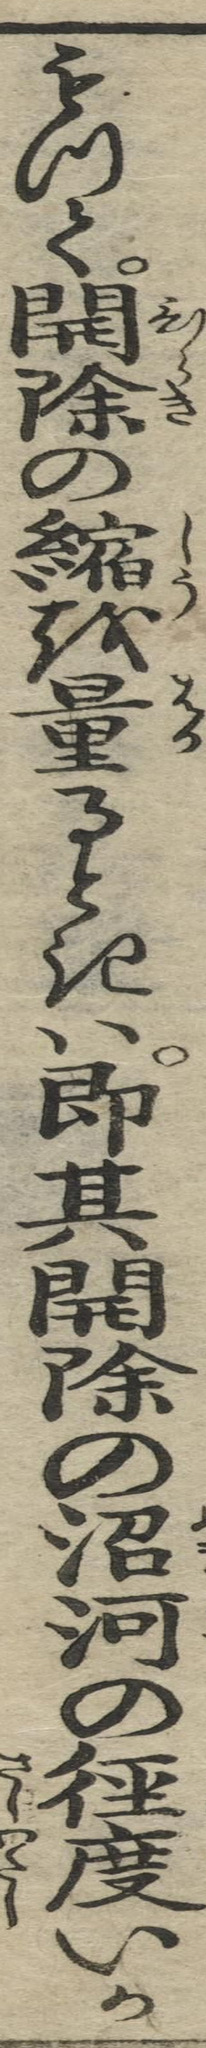もつて。開除の縮を量るときは。即其開除の沼河の経度いか
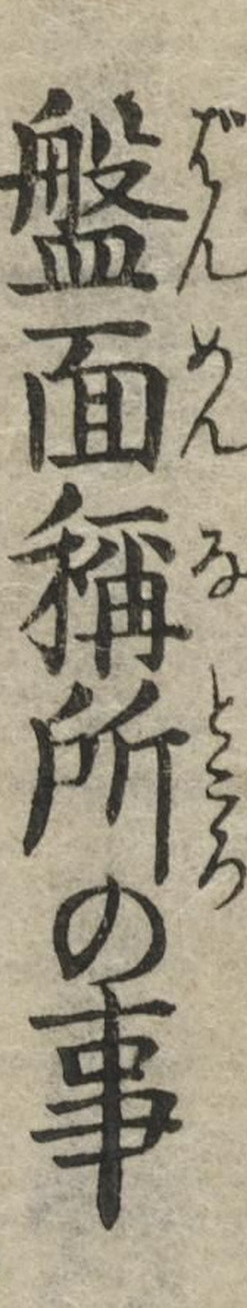盤面称所の事
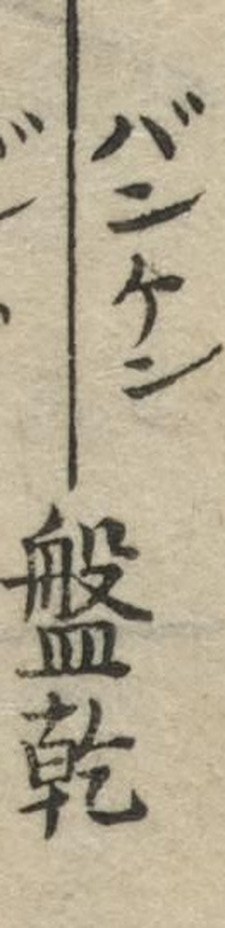バンケン盤乾
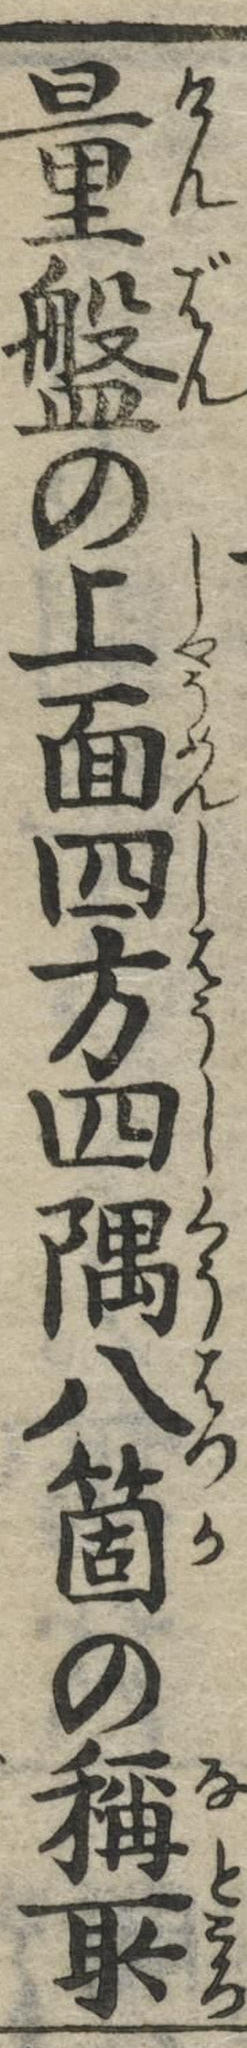量盤の上面四方四隅八箇の称所
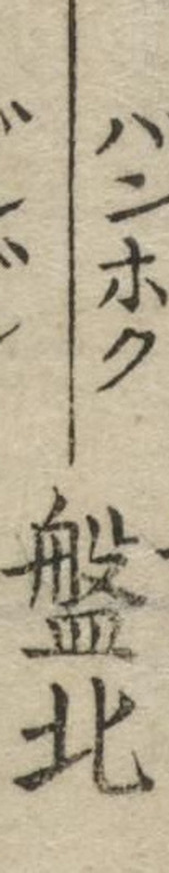バンホク盤北
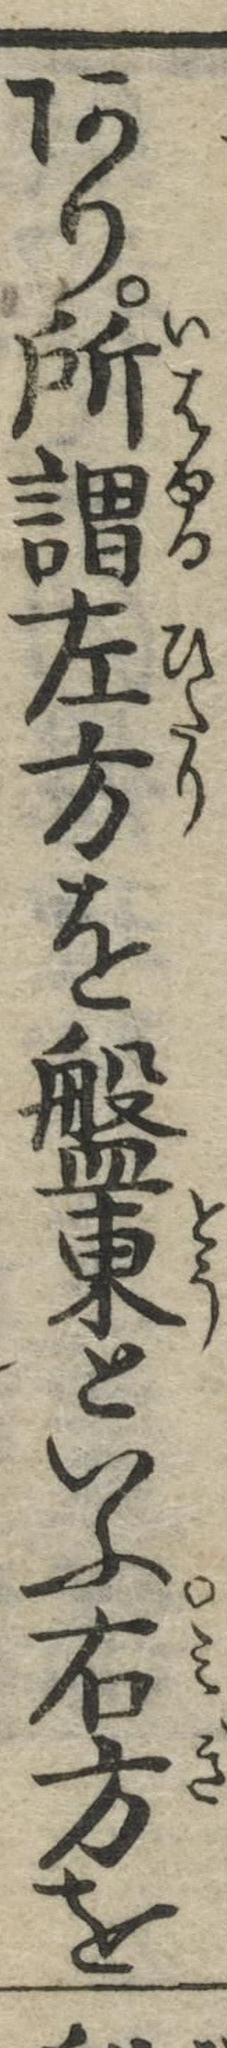あり。所謂左方を盤東といふ。右方を
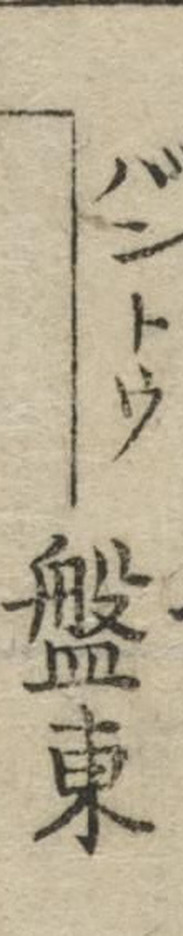バントウ盤東
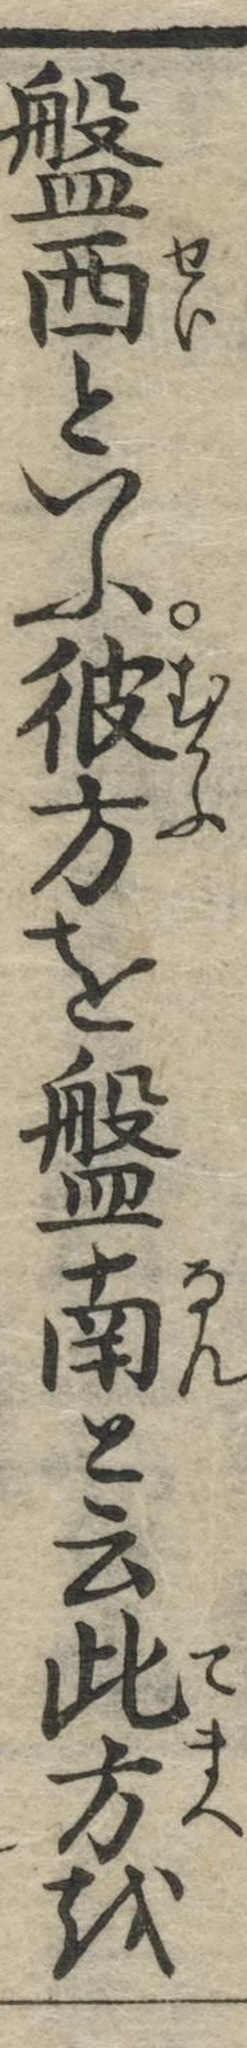盤西といふ。彼方を盤南と云此方を
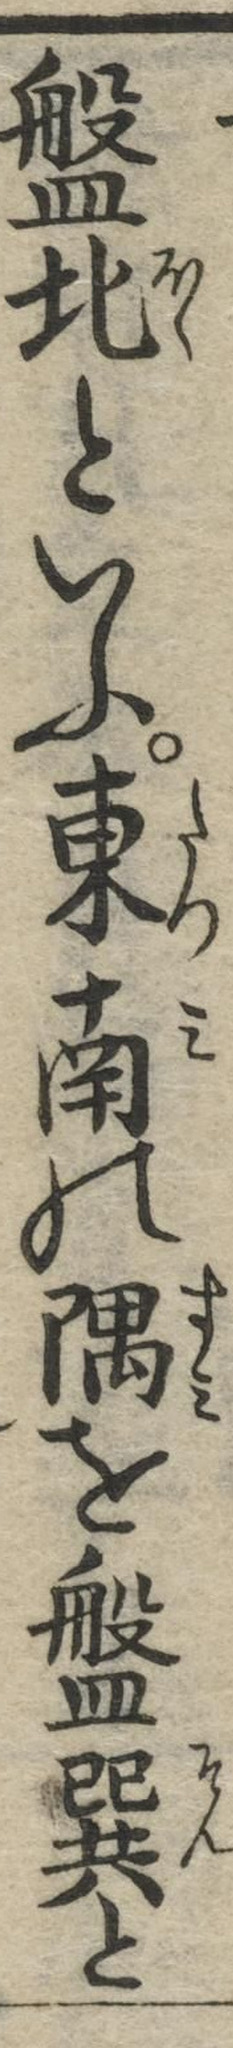盤北といふ。東南の隅を盤巽と
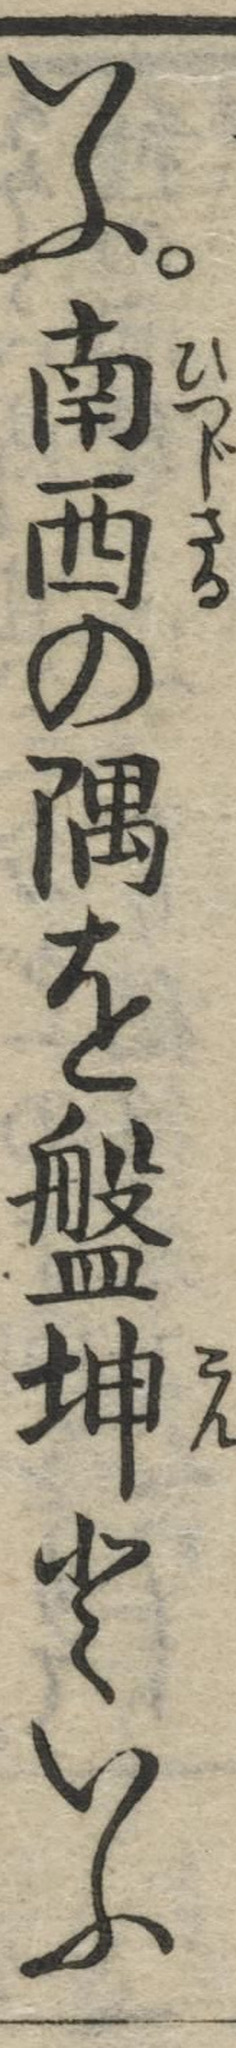いふ。南西の隅を盤坤といふ
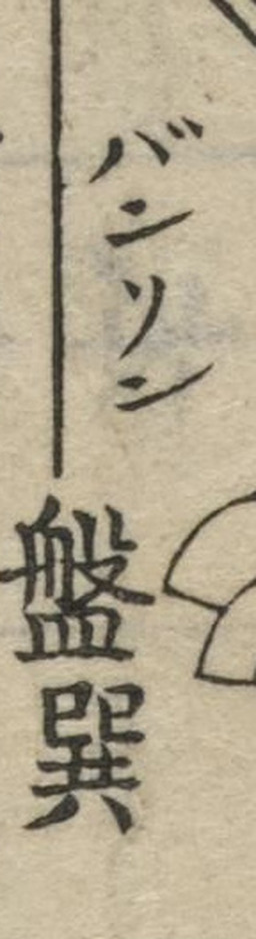バンソン盤巽
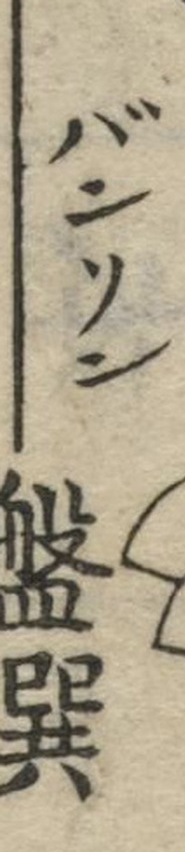バンソン盤巽
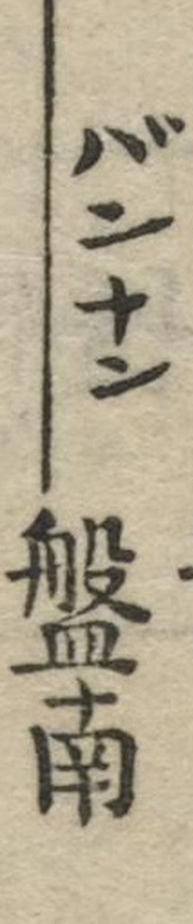バンナン盤南
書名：量地指南　巻之一（内題）
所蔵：東京大学地震研究所図書室 Earthquake Research Institute Library, The University of Tokyo, JAPAN
